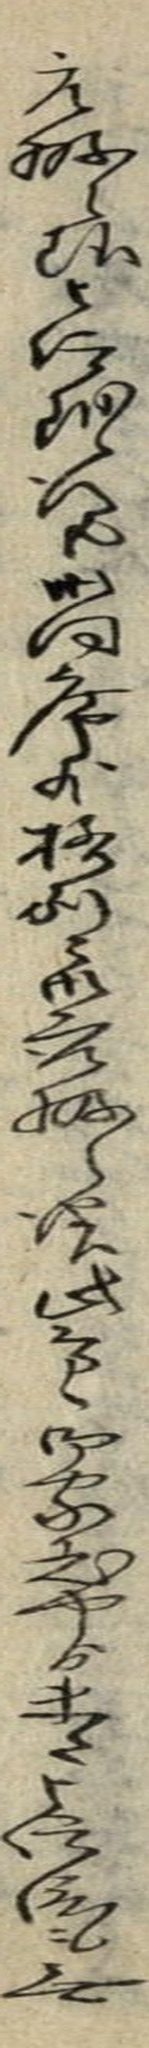取扱之趣被仰越候得共御同席外格別に御取扱之儀は此方へ御家老中ゟ未た被仰渡も無
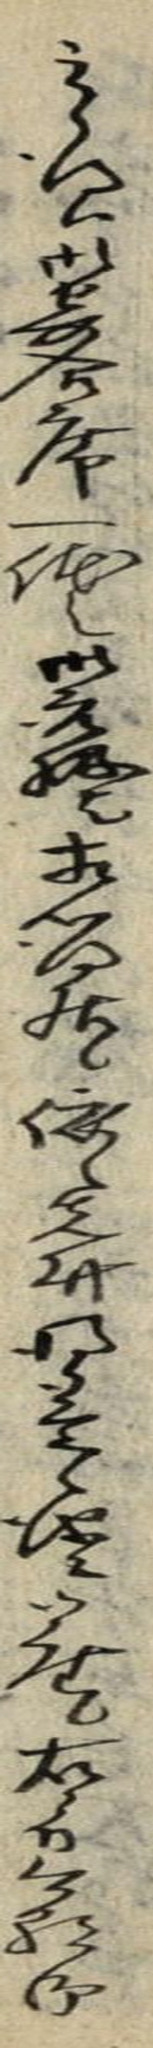之候得は御寄合席一体之御取扱と相心得居候依之先刻得御意候儀に御座候右に付今朝御
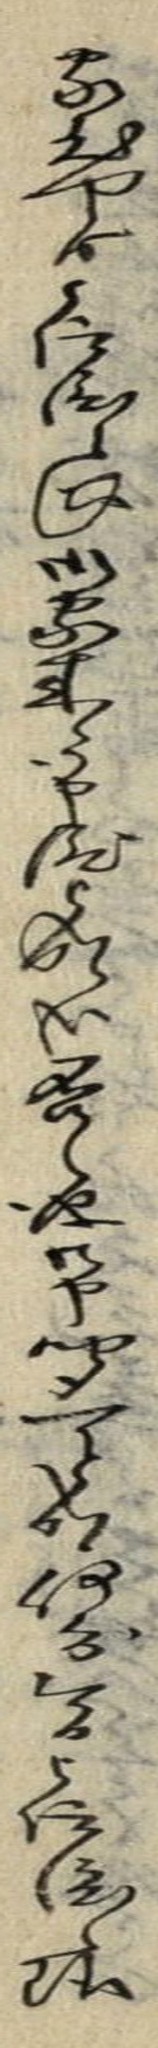家老中ゟ被仰渡候趣御家来へ御申渡被成候哉否之儀御申聞可被成候何分今日被仰渡候趣
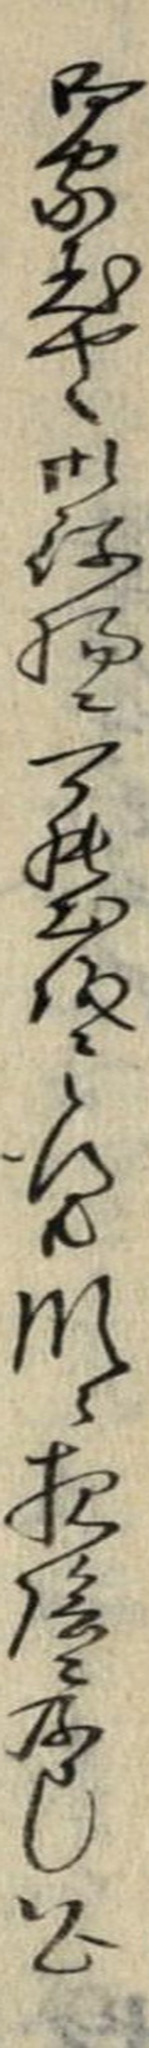御家老中へ御役柄に可罷出儀に候得共段々夜陰に及申候以上
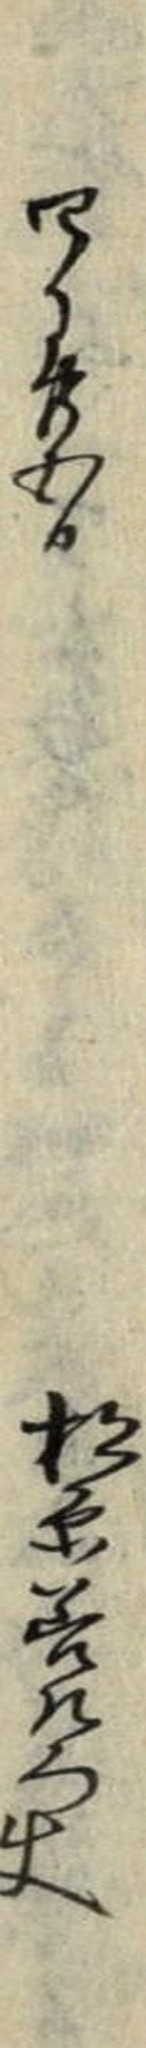四月廿五日松原善左衛門使
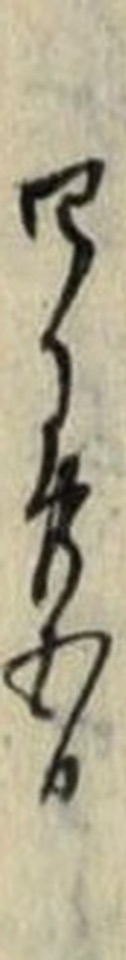四月廿五日
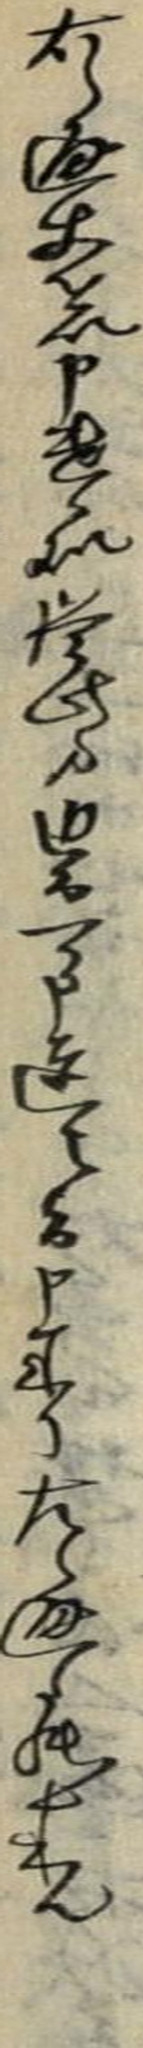右之通使を以申遣候処従此方追而可申達候旨申来り左之通手紙申来る
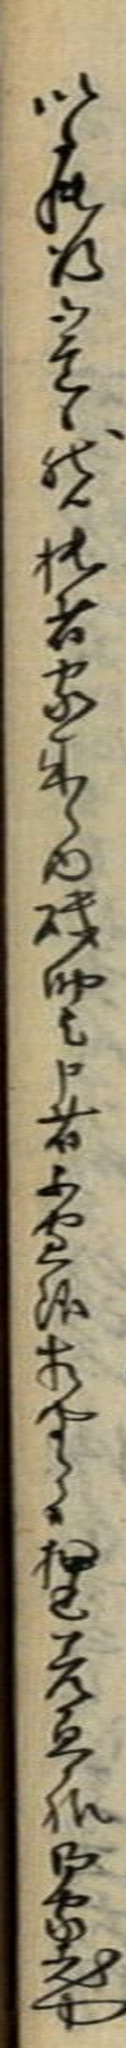以手紙得御意候然は拙者家来之内磯助と申者不宜趣相聞候に付押込差置候様御家老中
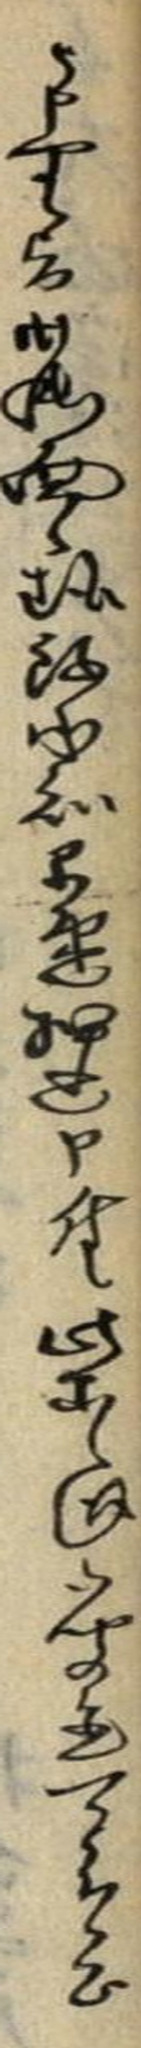被申聞候旨御紙面之趣致承知早速押込申付此等之趣御聞置可被下候以上
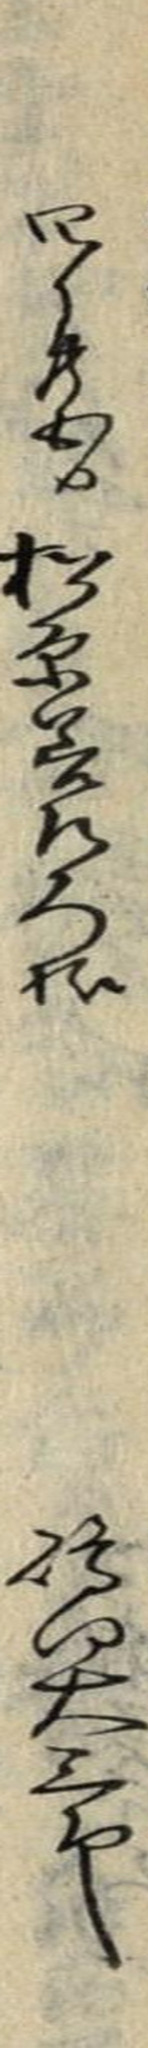四月二十五日松原善左衛門様嶋田大三郎
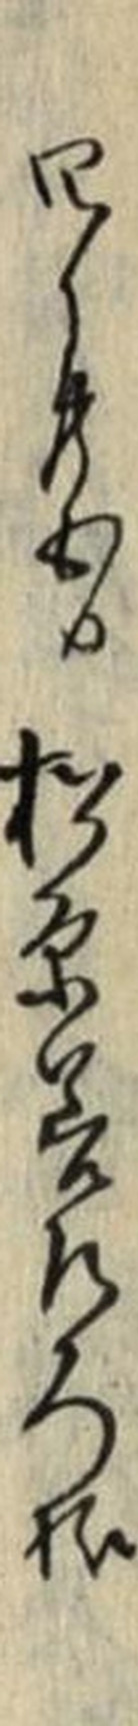四月廿五日松原善左衛門使
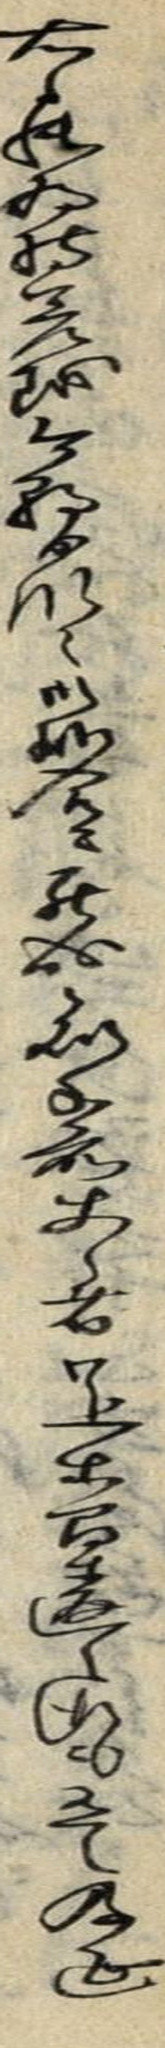右手紙為持差越今朝ゟ段々御掛合に罷成候処手前使之者口上等間違之趣も有之及延
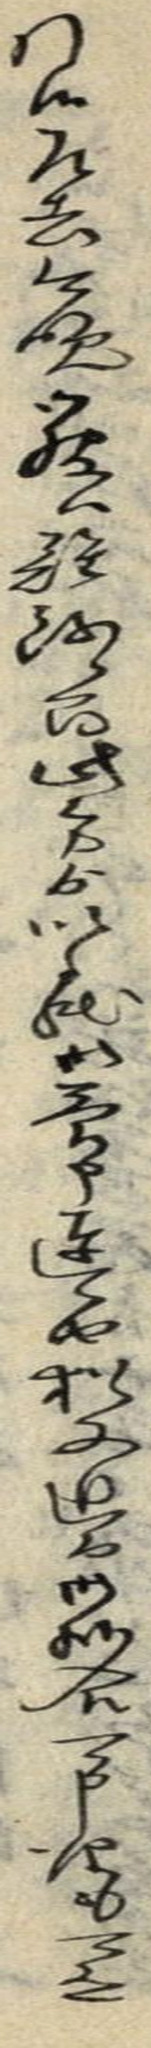引候乍去今晩御報は難致候間此方ゟ以手紙御答申達候由猶又追而御掛合可申儀も可有
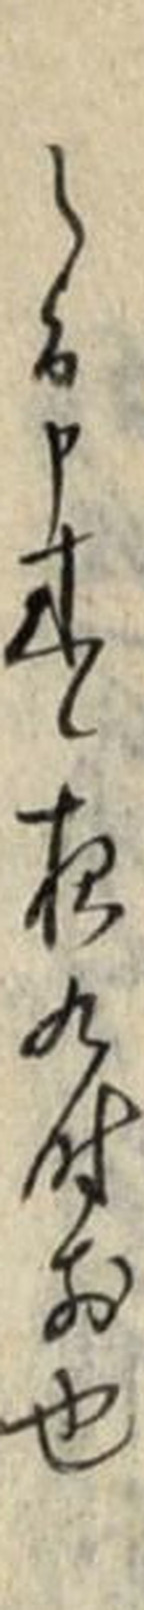之旨申来候夜九時前也
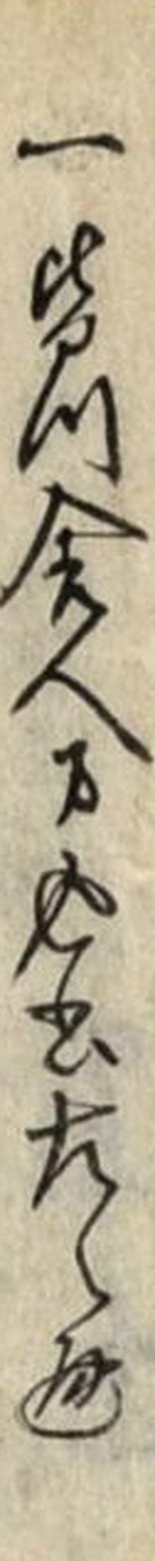一皆川舎人方返書左之通
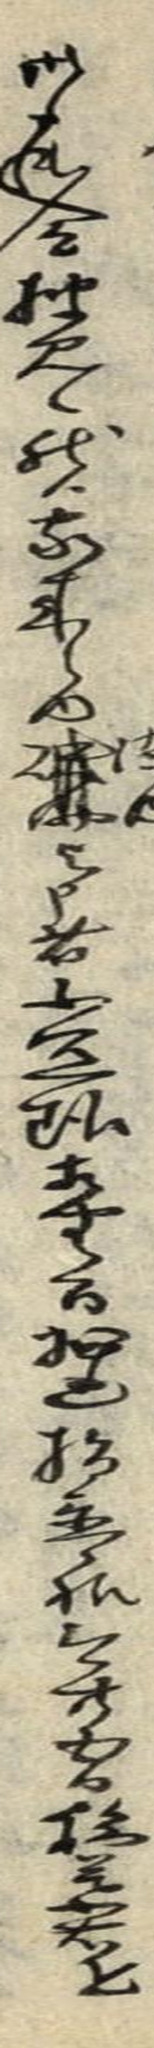御手紙令披見候然は家来之内磯内染内と申者不宜趣相聞候間押込指置候様今廿五日稻葉右近
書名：蒐輯之部
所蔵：福井県文書館 Fukui Prefectural Archives
